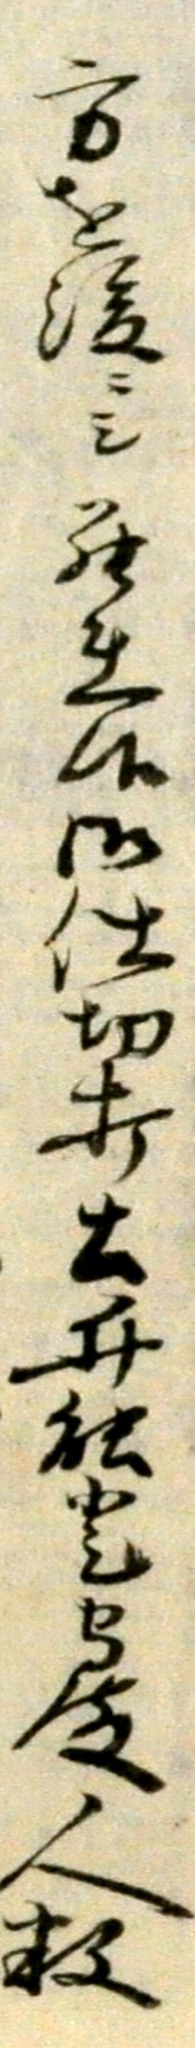方を後ニㇱ罷在候御仕切打土井能登守殿人数
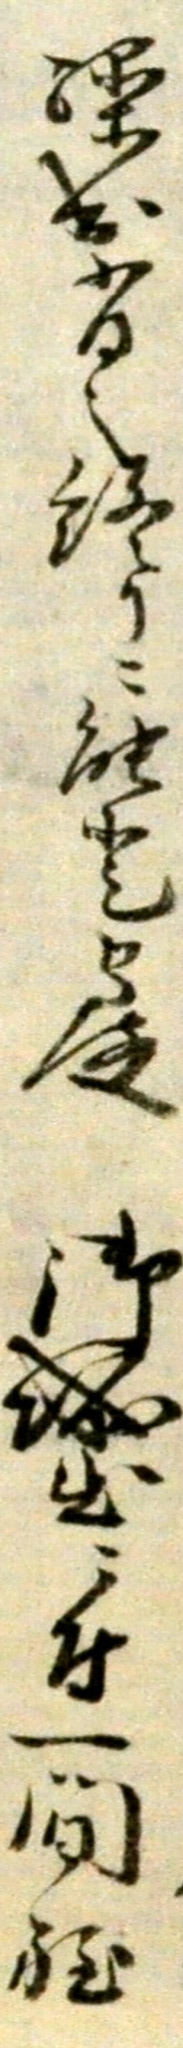操出有之終りニ能登守殿御城出ニ付一間程
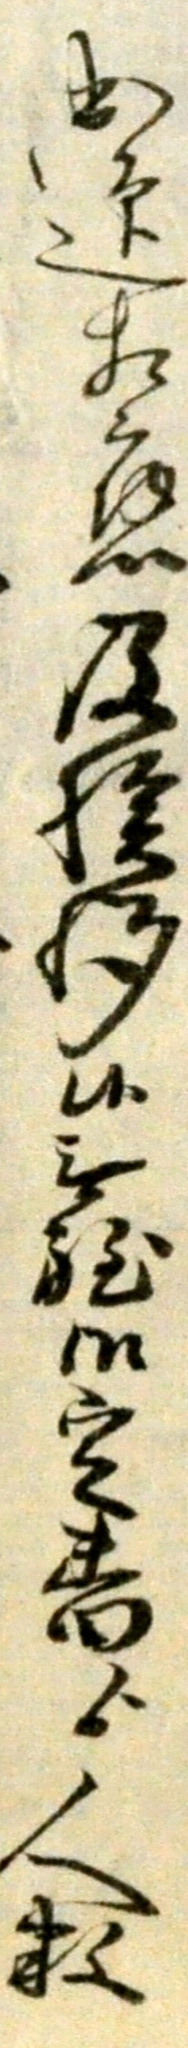出迎相応及挨拶候無程御定番ゟ人数
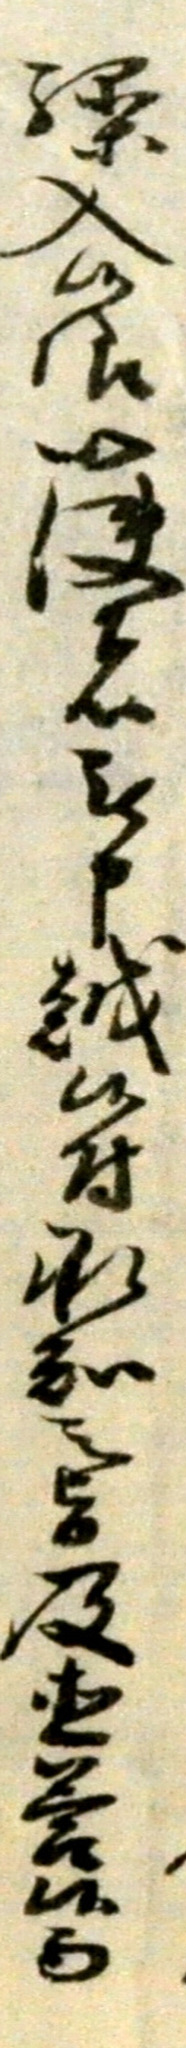繰入候様以使者被申越候付承知之旨及直答候而
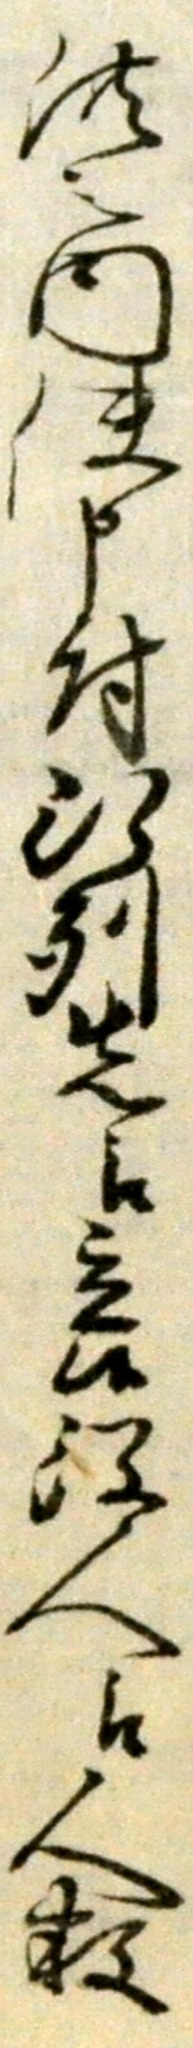供之内使申付行列先江立候役人江人数
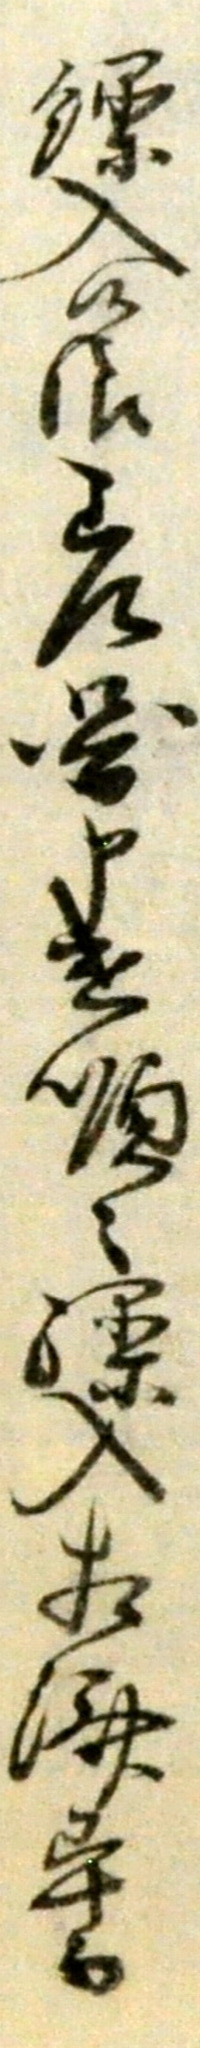繰入候様差図申遣順々繰入相済卆而

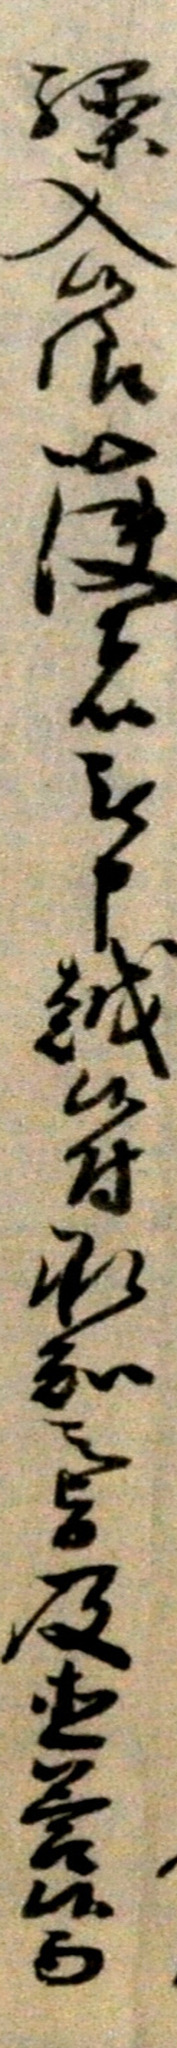繰入候様以使者被申越候付承知之旨及直答候而
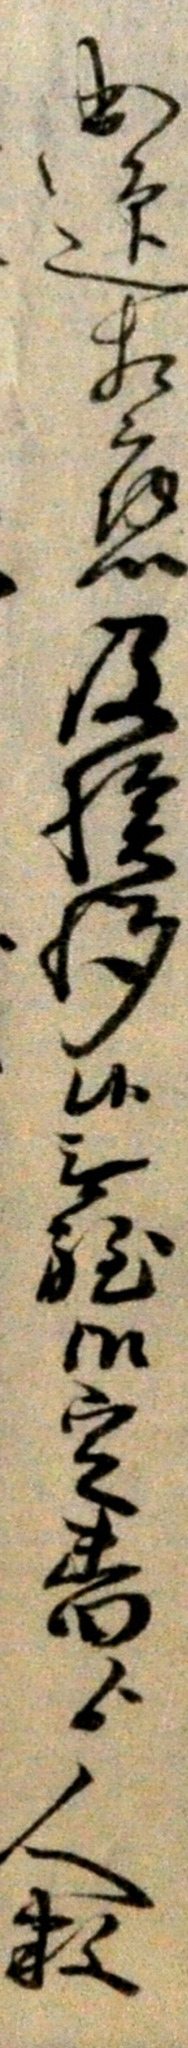出迎相応及挨拶候無程御定番ゟ人数
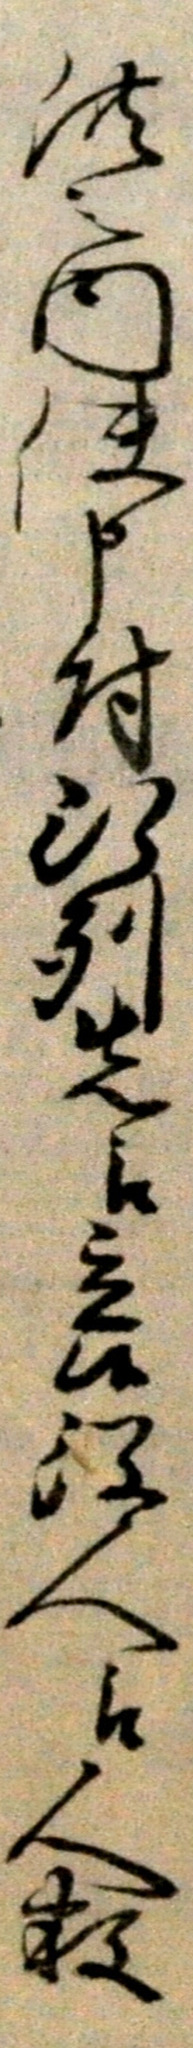供之内使申付行列先江立候役人江人数
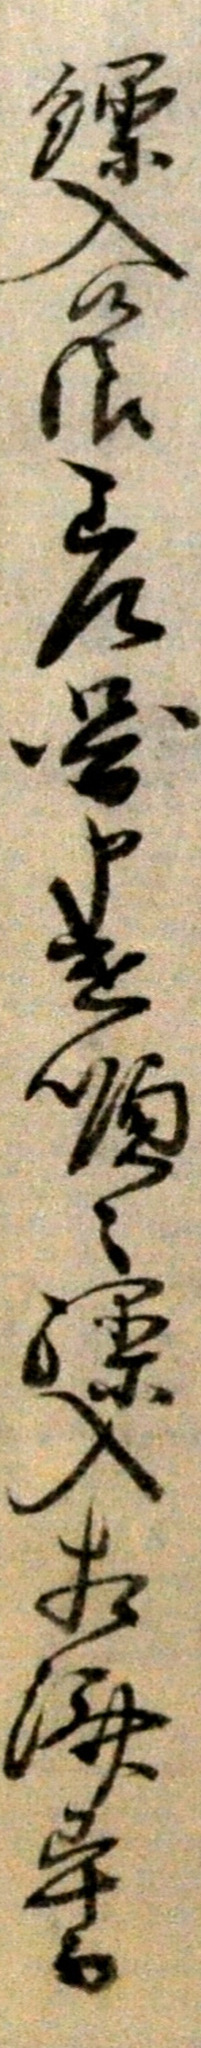繰入候様差図申遣順々繰入相済畢而
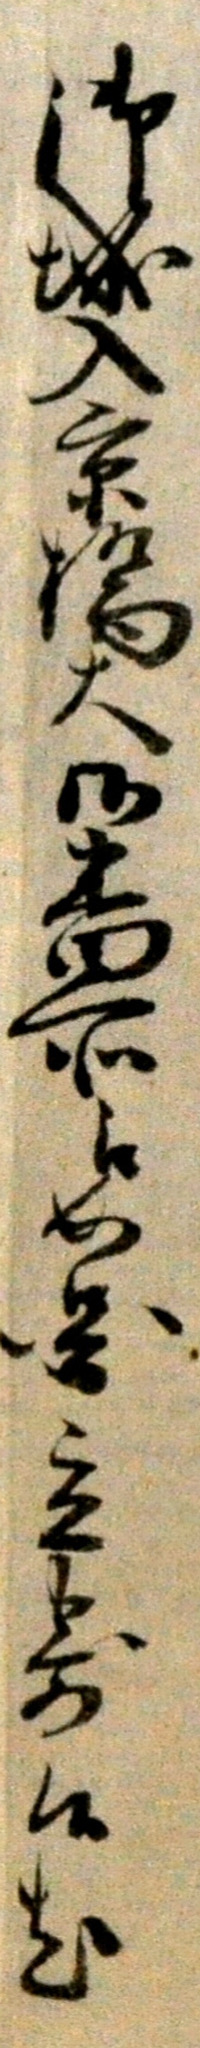御城入京橋大御番所江如図立寄候尤
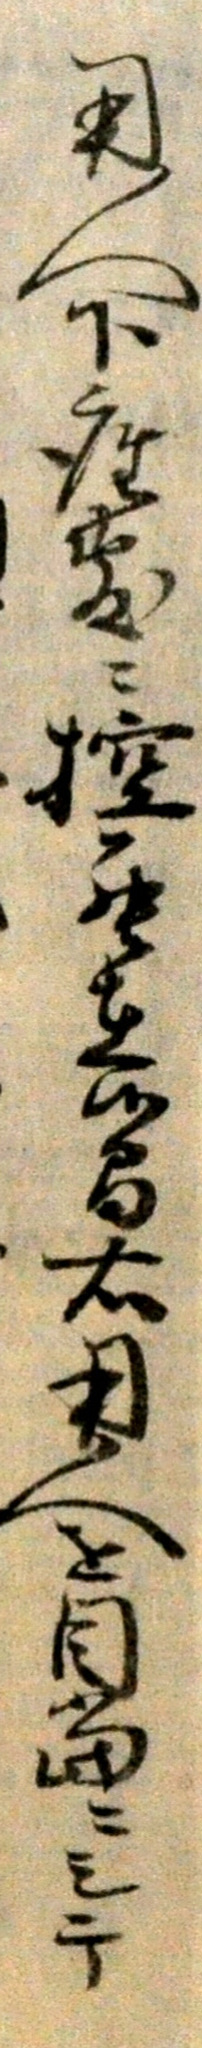用人下座敷二控罷在候間右用人を目当ニシテ
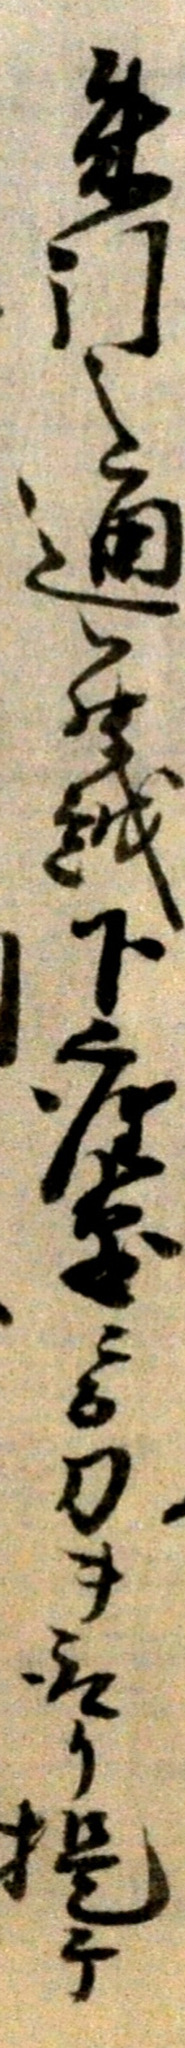朱引之通罷越下座敷ニ而刀ヲ取り提ケ
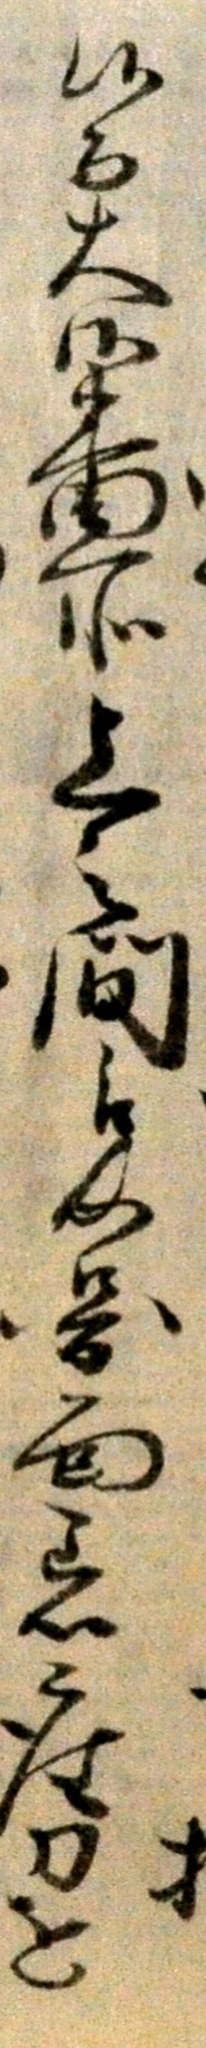候而大御番所上之間江如図面着座刀を
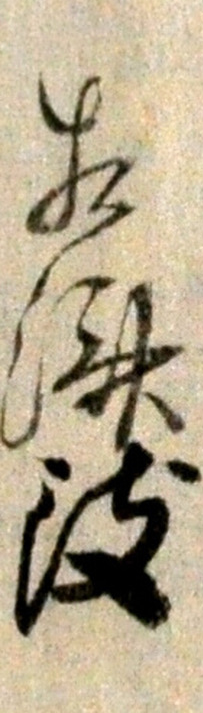相済致
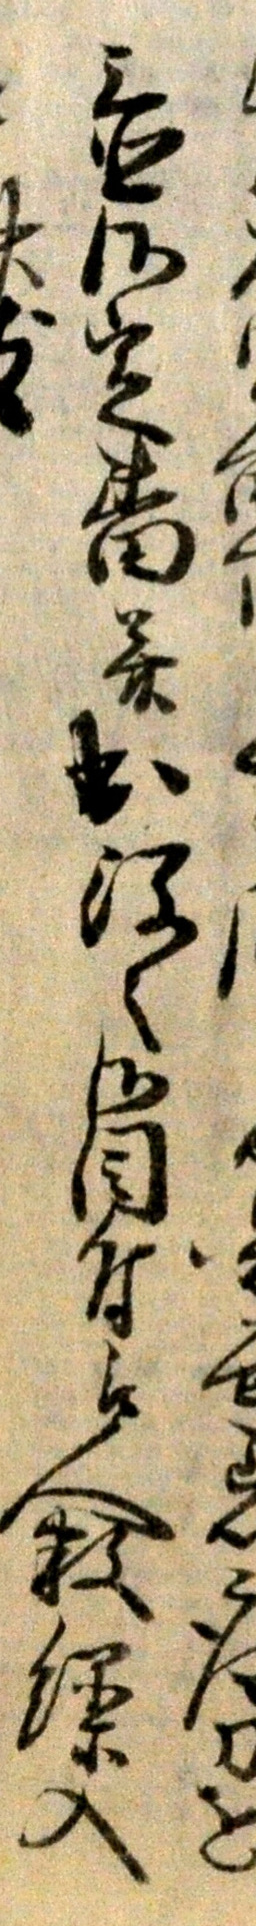置御定番幷出役之御目付江人数繰入
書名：大阪加番関係諸書留〔一括〕
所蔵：伊那市立高遠町図書館・合同会社AMANE
